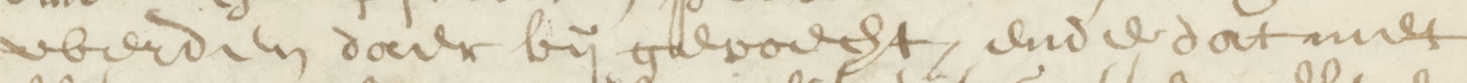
werden daer bij gevoecht, ende dat met
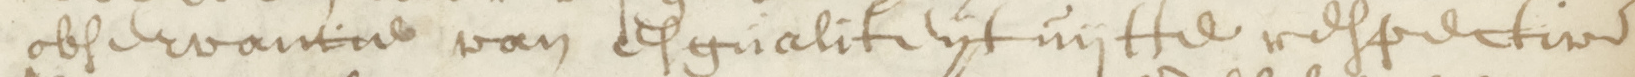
observantie van Esgualiteijt uijtte respective
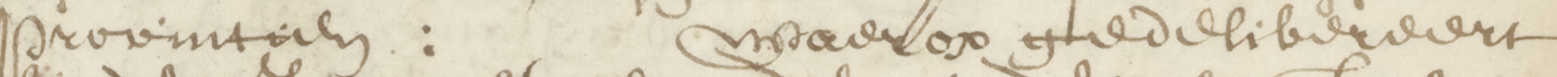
Provintien: Waerop gedelibereert
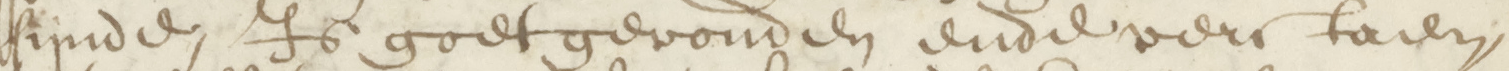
sijnde, Is goetgevonden ende verstaen,
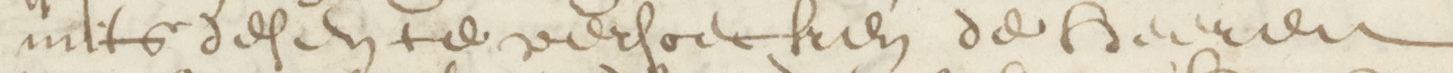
mits desen te versoecken de Heeren
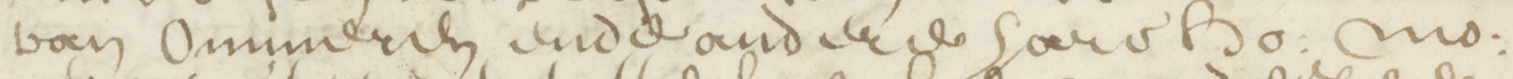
van Ommeren ende andere hare Ho:Mo:
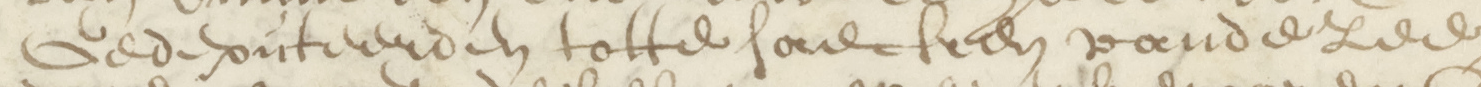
Gedeputeerden totte saecken vande Zee,
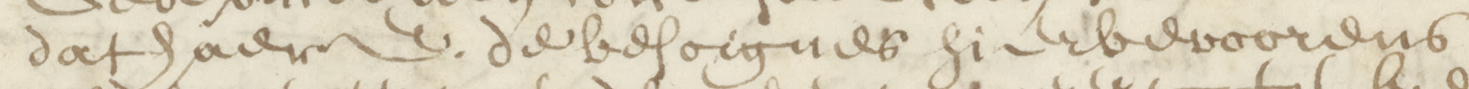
dat haer E. de besoignes hierbevoorens
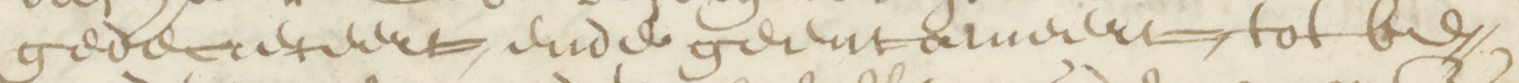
gedecreteert, ende geentameert, tot be„
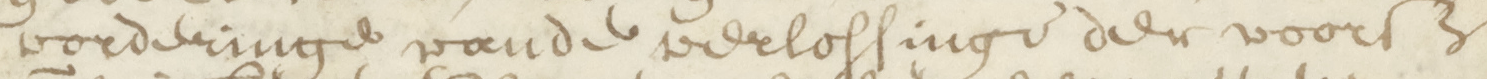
vorderinge vande verlossinge der voors
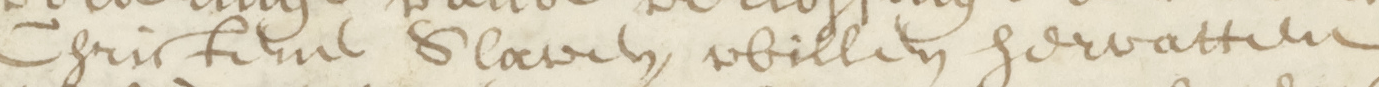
Christene Slaven, willen hervatten
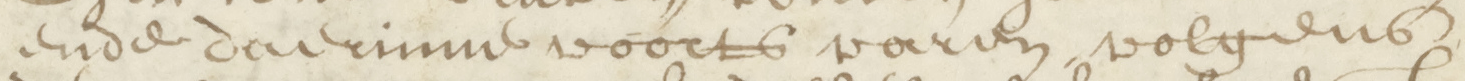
ende daerinne voorts varen volgens
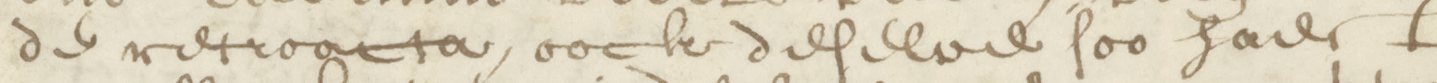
de retroacta, oock deselve soo haest
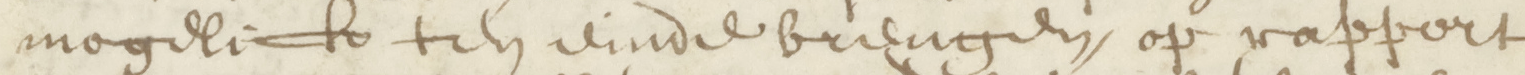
mogelick ten einde brengen, op rapport
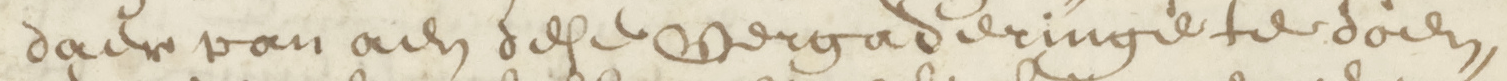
daer van aen dese Vergaderinge te doen.
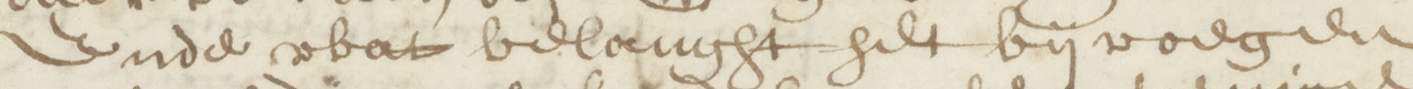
Ende wat belanght het bijvoegen
